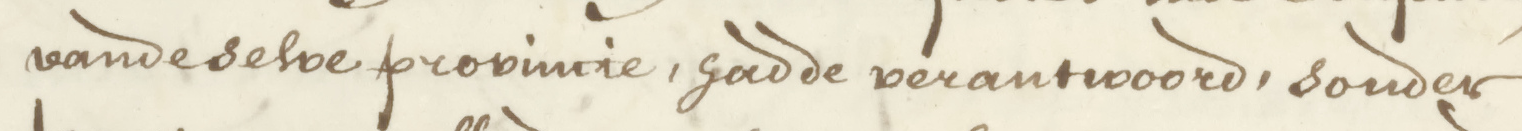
vande selve provincie, hadde verantwoord, sonder
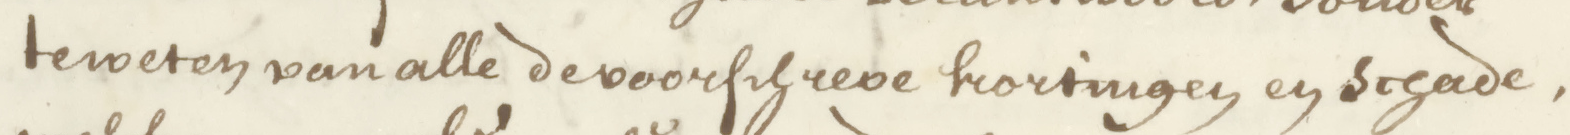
te weten van alle de voorschreve kortingen en schade,
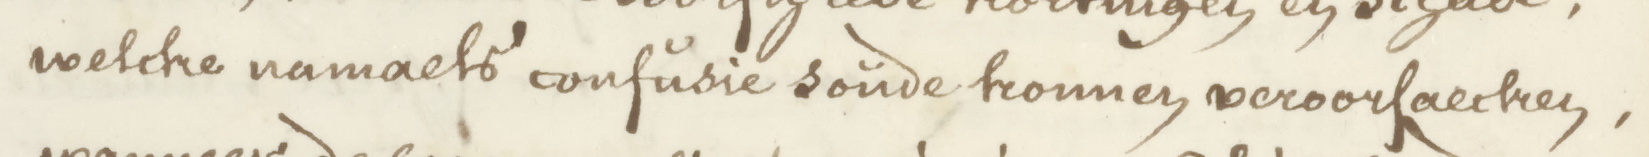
welcke namaels confusie soude konnen veroorsaecken,
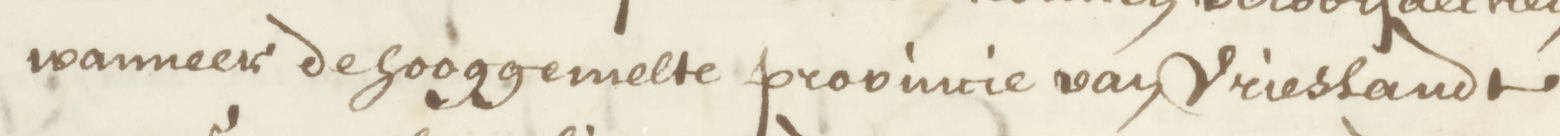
wanneer de hooggemelte provincie van Vrieslandt
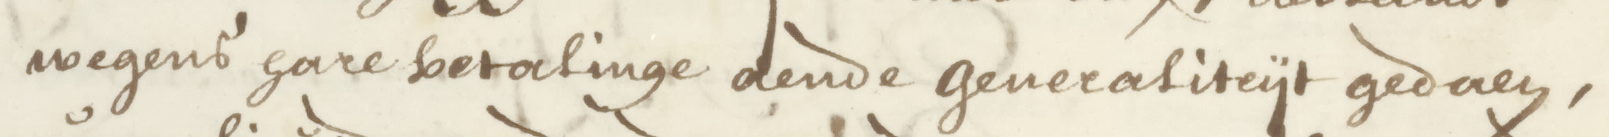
wegens hare betalinge aende Generaliteijt gedaen,
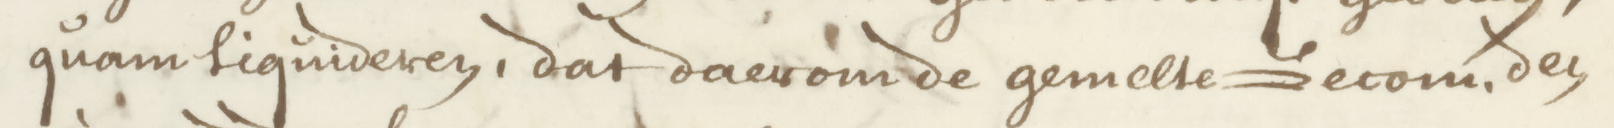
quam liquideren, dat daerom de gemelte Gecom.den
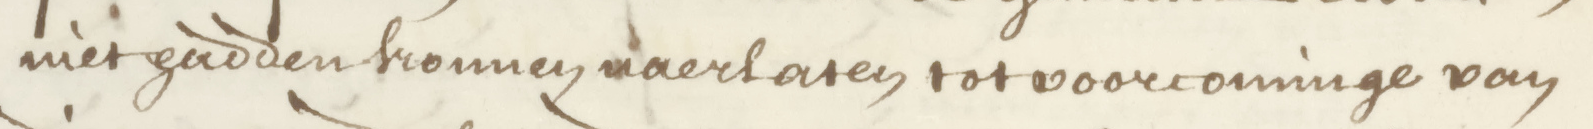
niet hadden konnen naerlaten tot voorcominge van
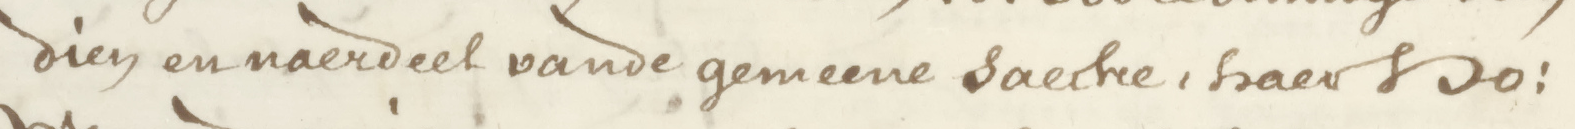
dien en naerdeel vande gemeene Saecke, haer Ho:
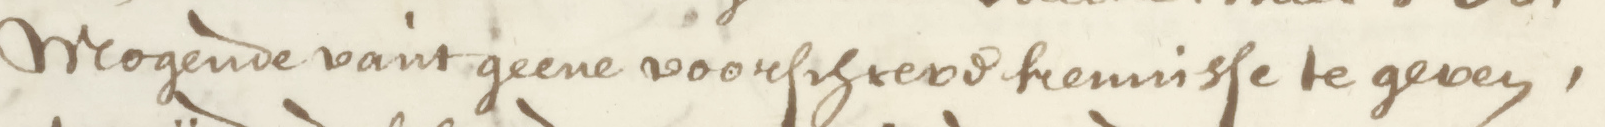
Mogende van‛t geene voorschreve kennisse te geven,
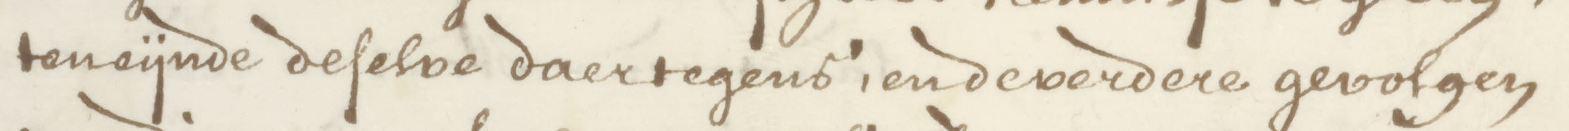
teneijnde deselve daer tegens, ende verdere gevolgen
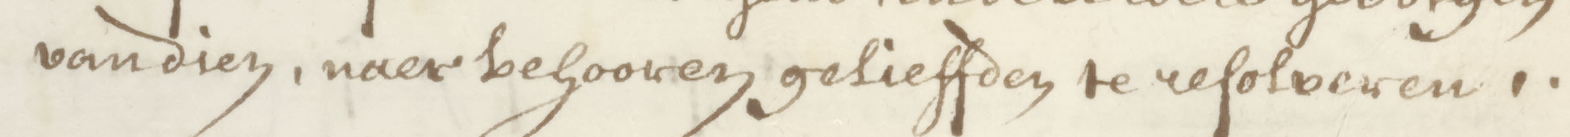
vandien, naer behooren gelieffden te resolveren,
